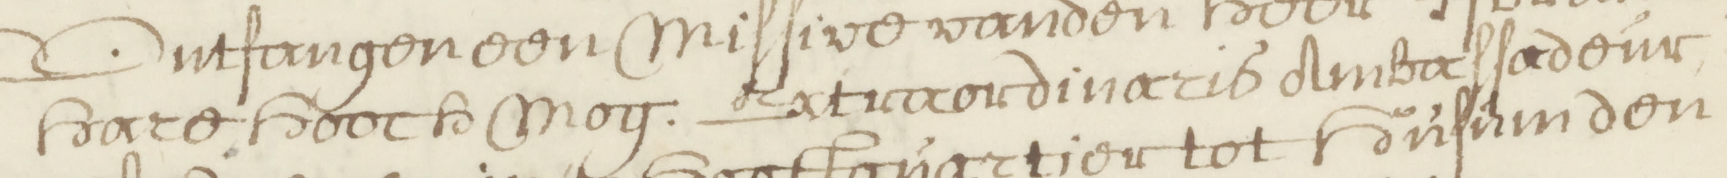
hare hooch Mog: Extraordinaris Ambassadeur
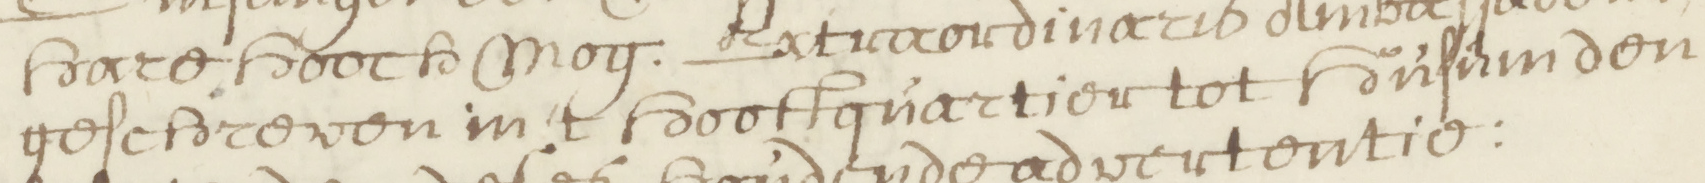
geschreven in 't hooftquartier tot Husum den
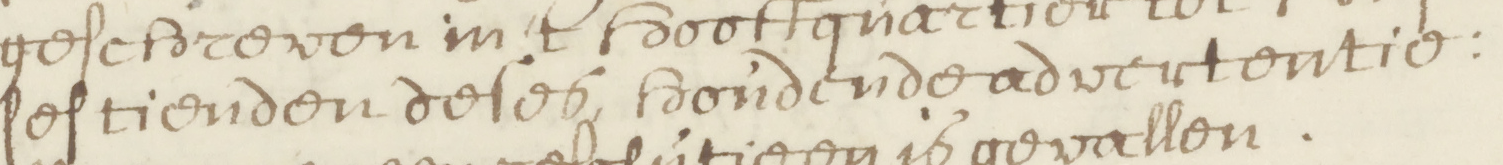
sestienden deses, houdende advertentie:
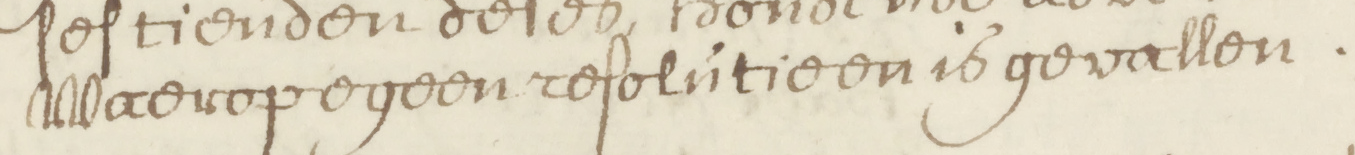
Waerop egeen resolutie en is gevallen.
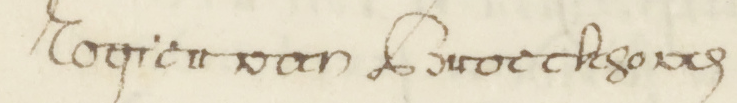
rogier van Broeckhoven
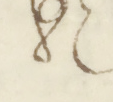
ca.
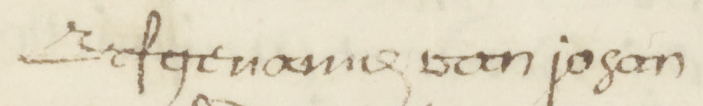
Erfgename van johan
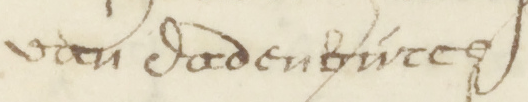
van Dadenburch
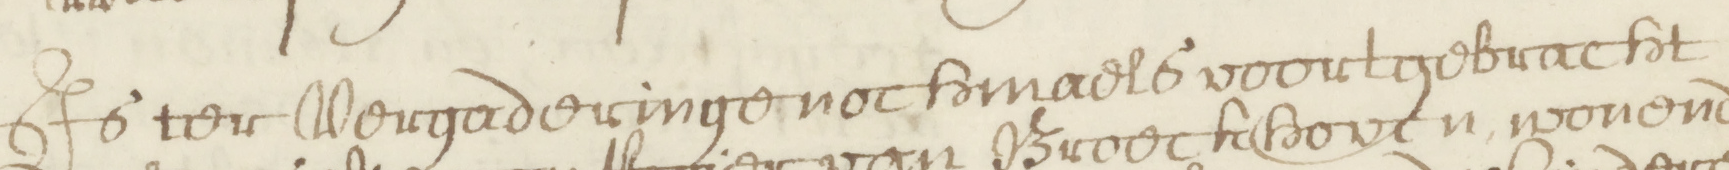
Is ter Vergaderinge nochmaels voortgebracht
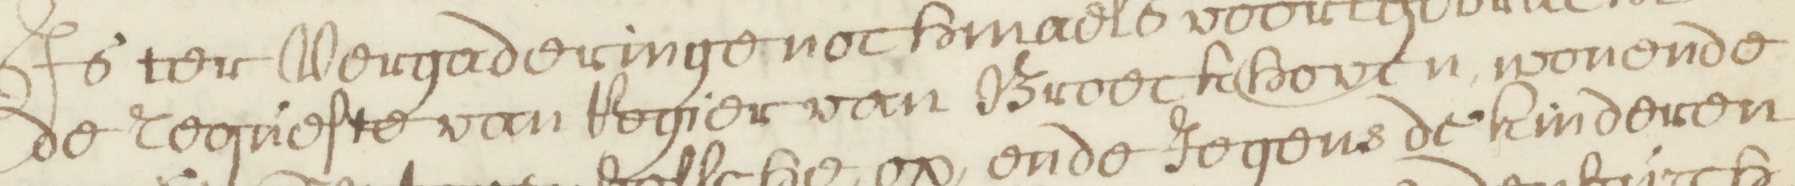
de requeste van Rogier van Broeckhoven, wonende
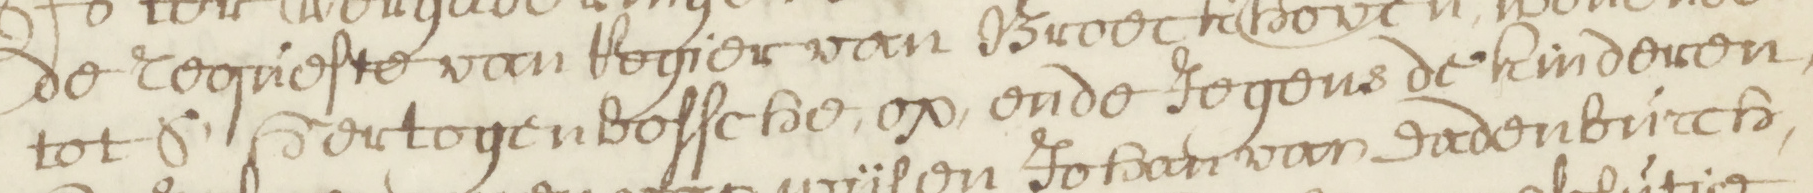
tot S‛ Hertogenbossche, op, ende Jegens de kinderen,
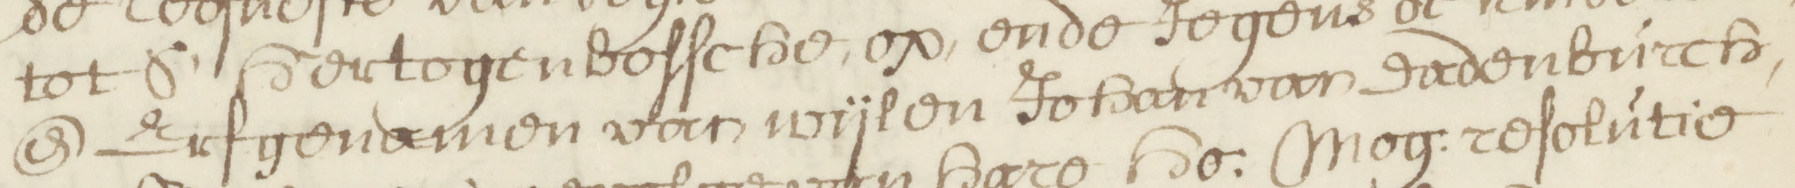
& Erfgenamen van wijlen Johan van Dadenburch,
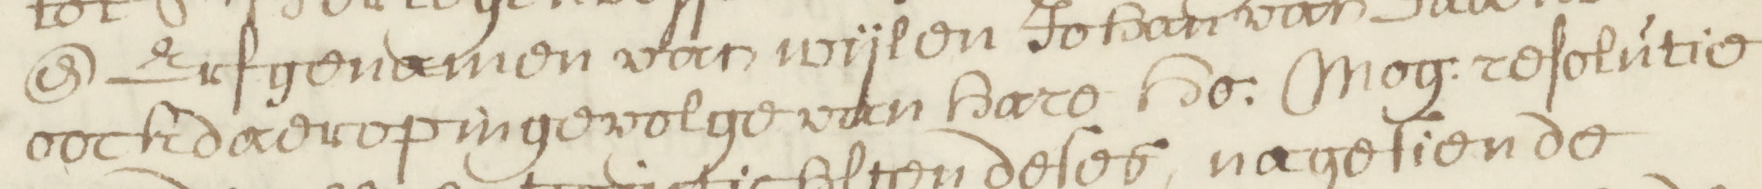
oock daerop ingevolge van hare Ho:Mog: resolutie
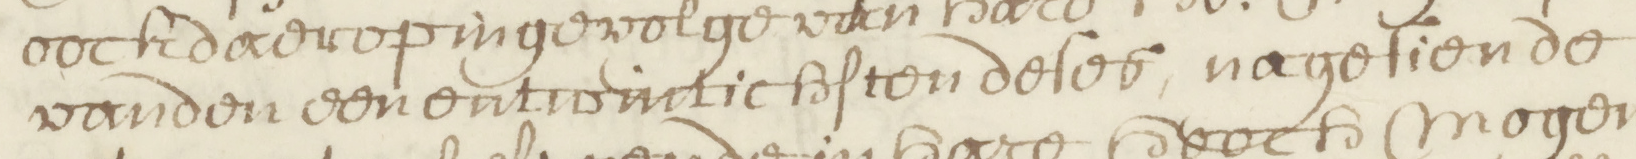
vanden een entwintichsten deses, nagesien de
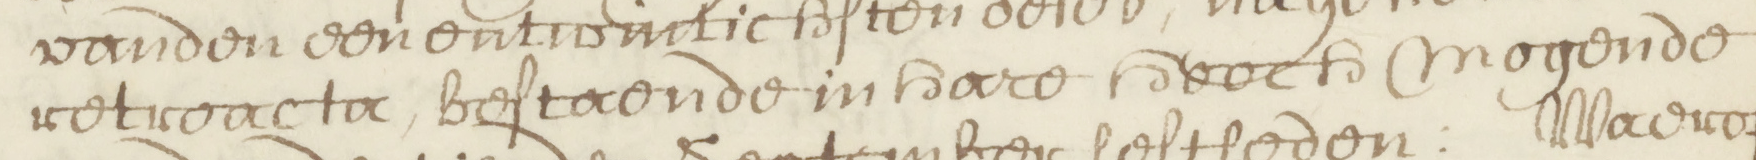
retroacta, bestaende in hare Hooch Mogende
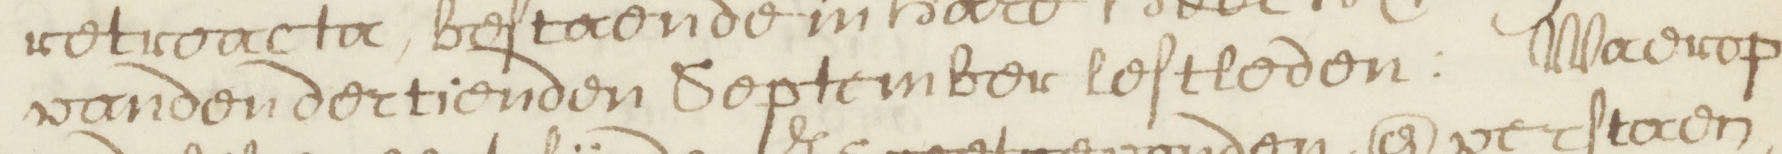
vanden dertienden September lestleden: Waerop
